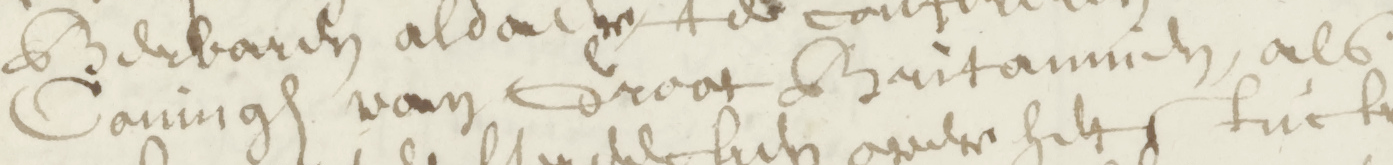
Coningh van Groot Britannien, als
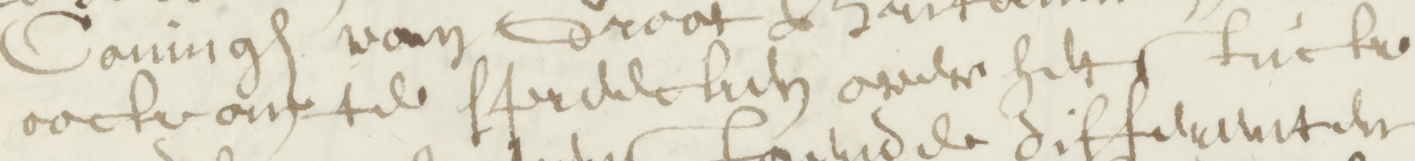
oock om te spreecken over het stuck
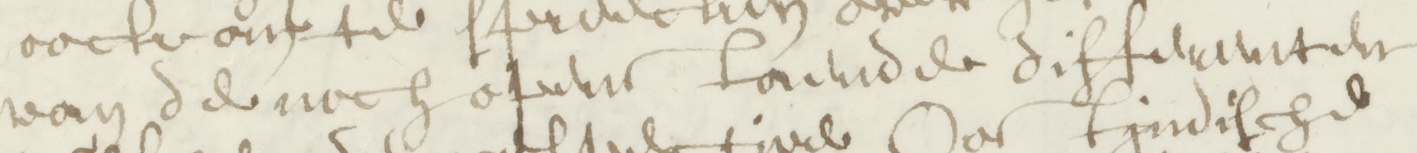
van de noch openstaende differenten
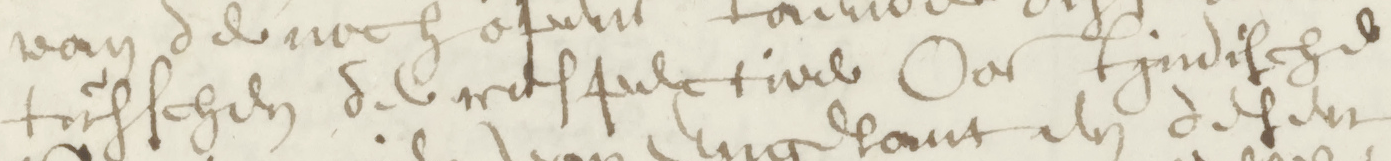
tusschen de respective Oostindische
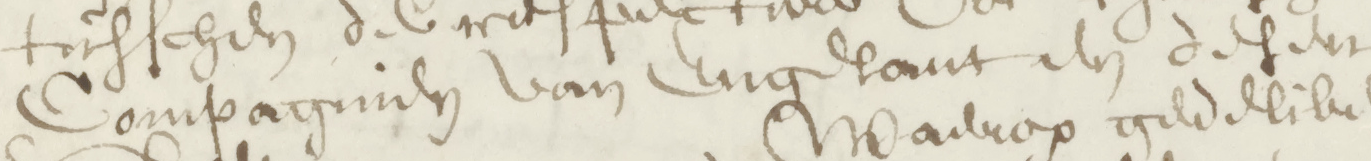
Compagnien van Engelant en desen
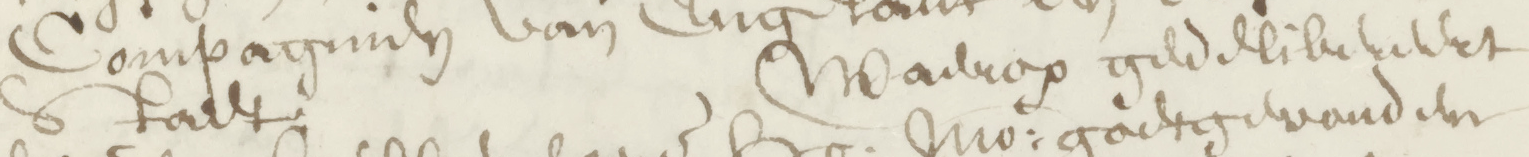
Staet: Waerop gedelibereert
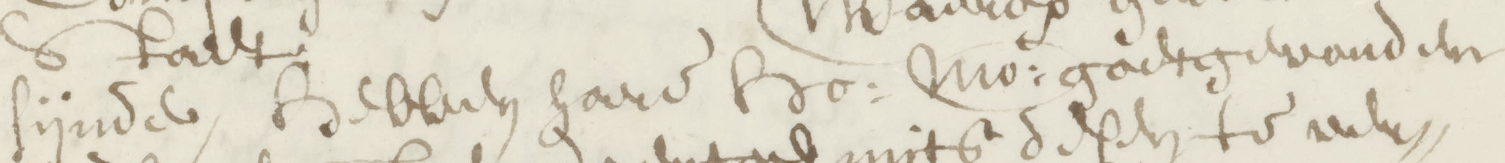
sijnde, hebben hare Ho:Mo: goetgevonden
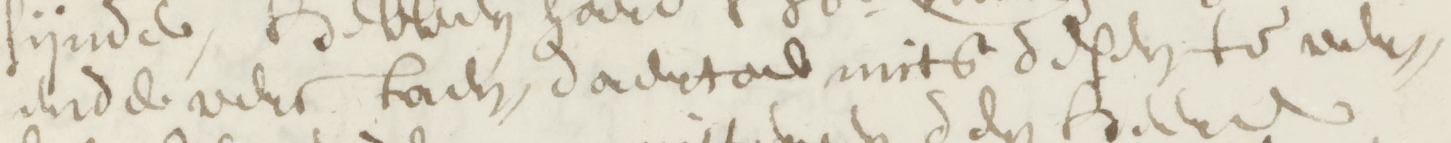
ende verstaen, daertoe mits desen te ver„
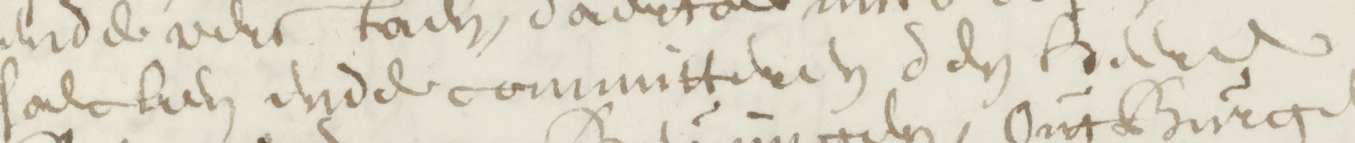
soecken ende committeren den Heere
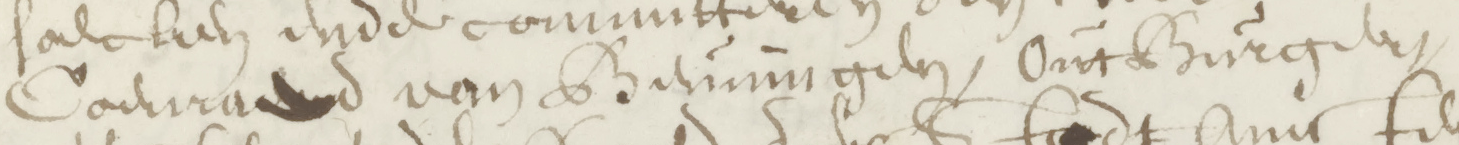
Coenraed van Beuningen, Out Burger„
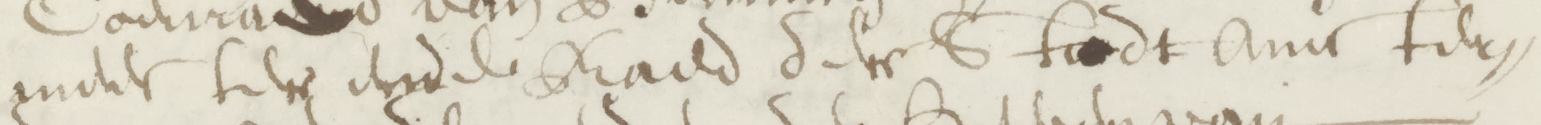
meester ende Raed der Stadt Amster„
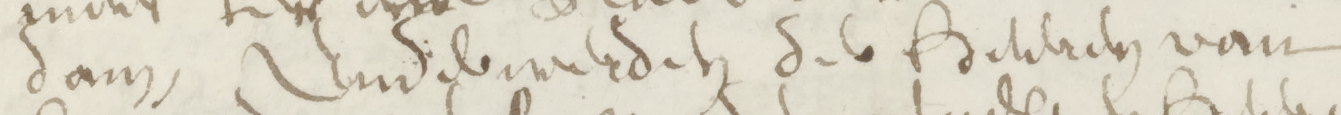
dam. Ende werden de Heeren van
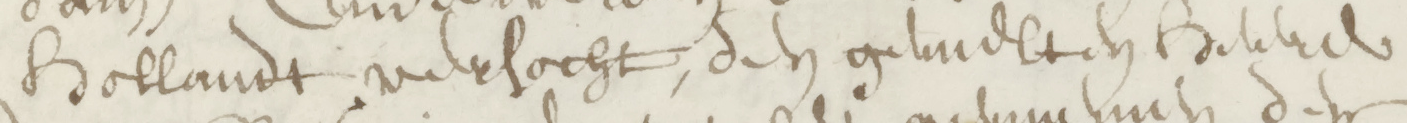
Hollandt versocht, den gemelten Heere
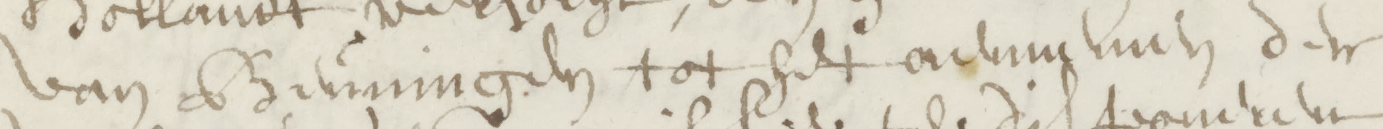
van Beuningen tot het aennemen der
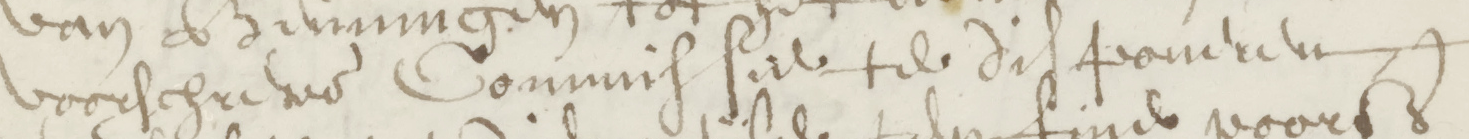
voorschreve Commissie te disponeren,
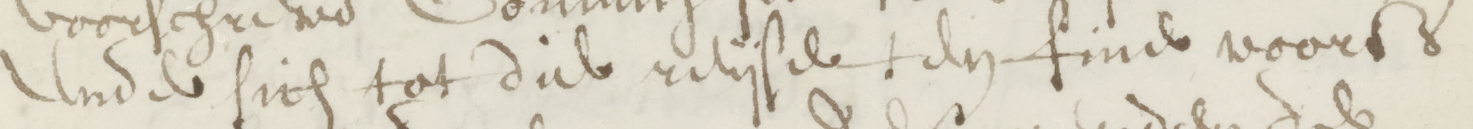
Ende sich tot die reijse ten fine voors
